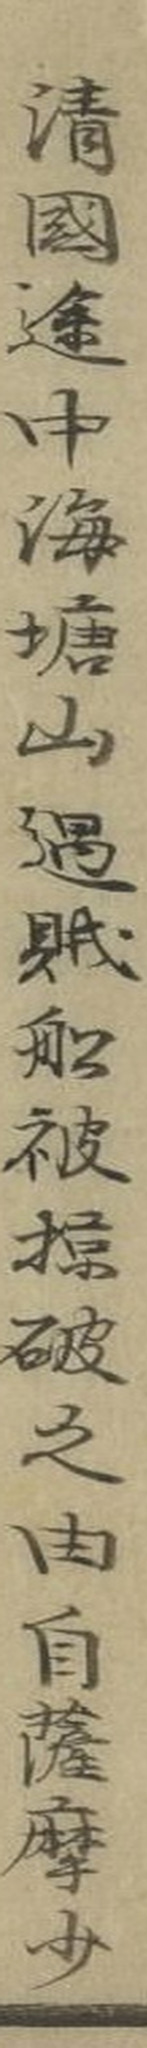清国途中海塘山遇賊舩被掠破之由自薩摩少
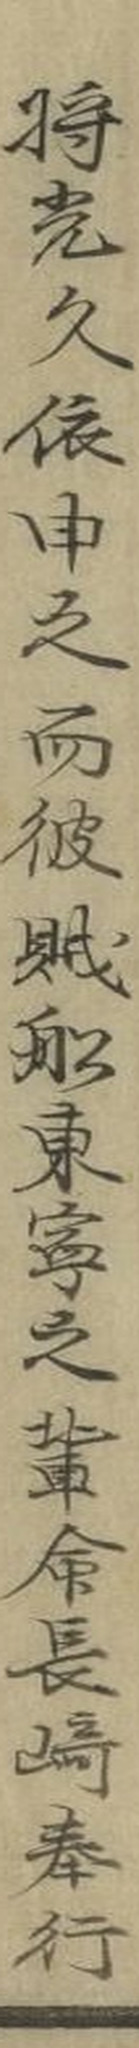将光久依申之而彼賊舩東寧之輩命長崎奉行
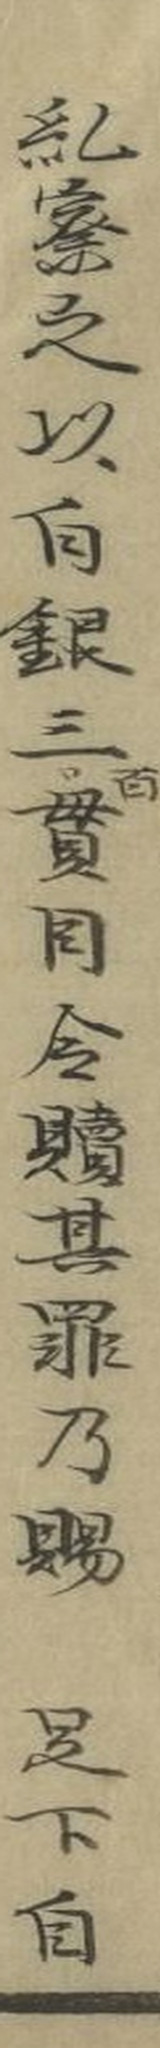糺察之以白銀三百貫目令贖其罪乃賜足下自
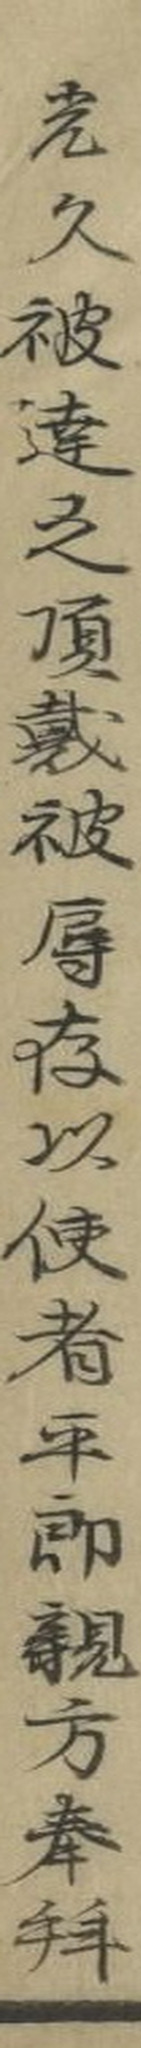光久被達之頂戴被辱存以使者平郎親方奉拝

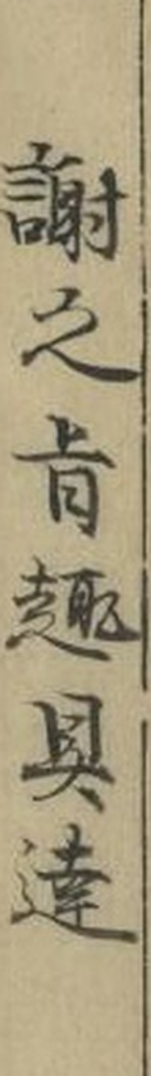謝之旨趣具達
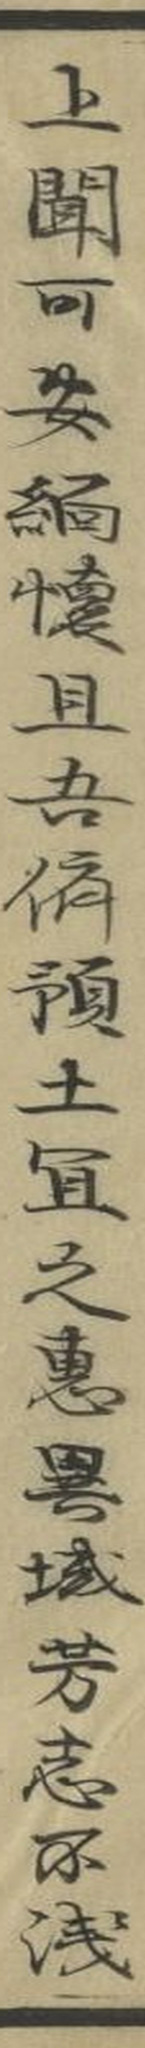上聞可安緬懐且吾済預土冝之恵異域芳志不浅
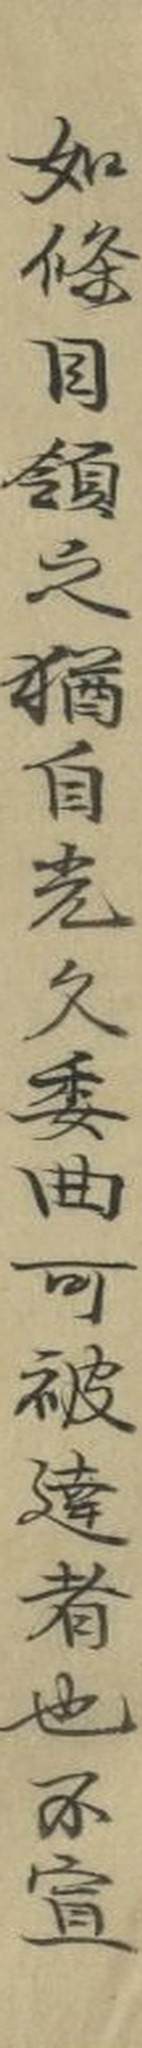如條目領之猶自光久委曲可被達者也不宣
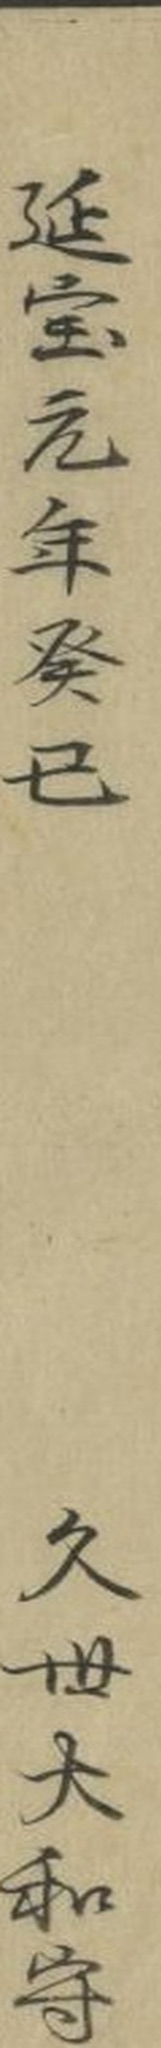延宝元年癸丑久世大和守
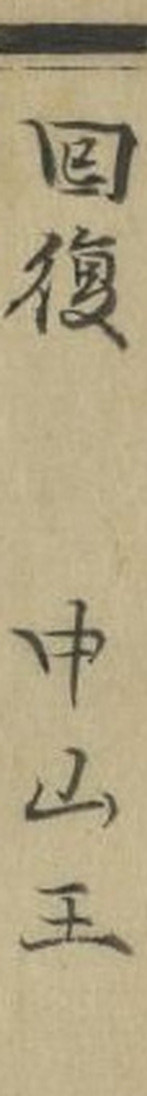回復中山王
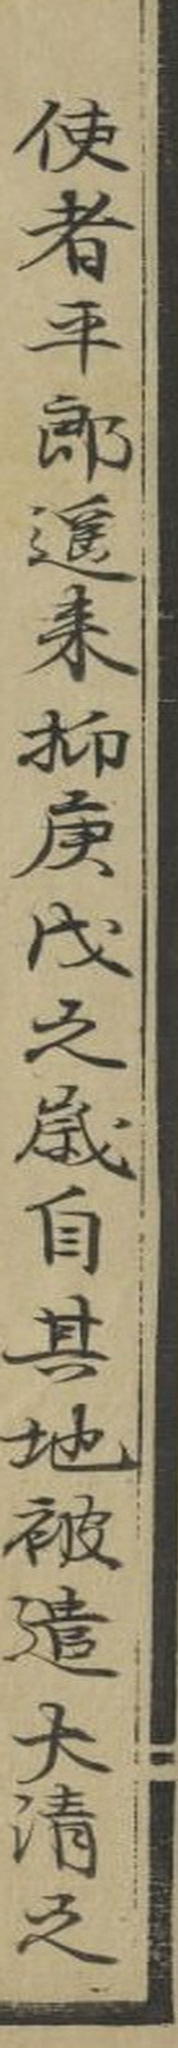使者平郎遥来抑庚戌之歳自其地被遣大清之
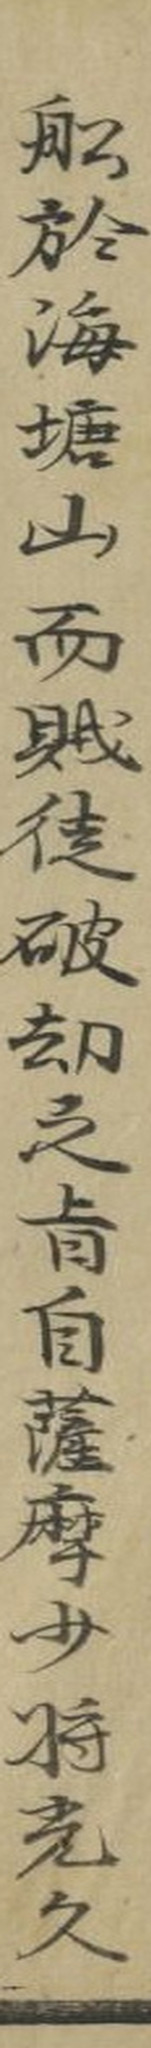舩於海塘山而賊徒破却之旨自薩摩少将光久
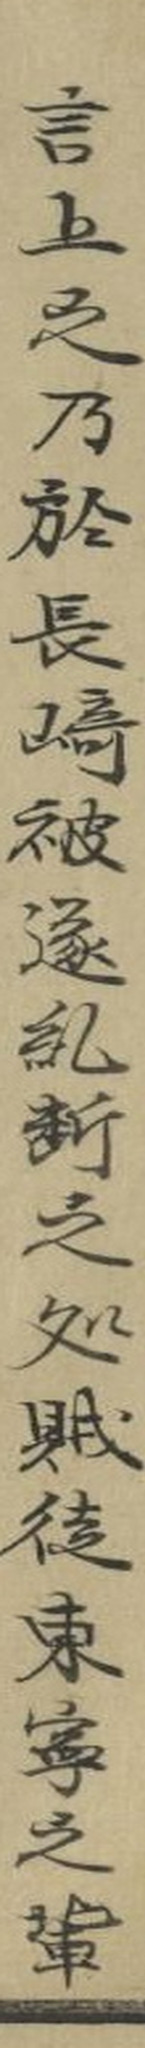言上之乃於長崎被遂糺断之処賊徒東寧之輩
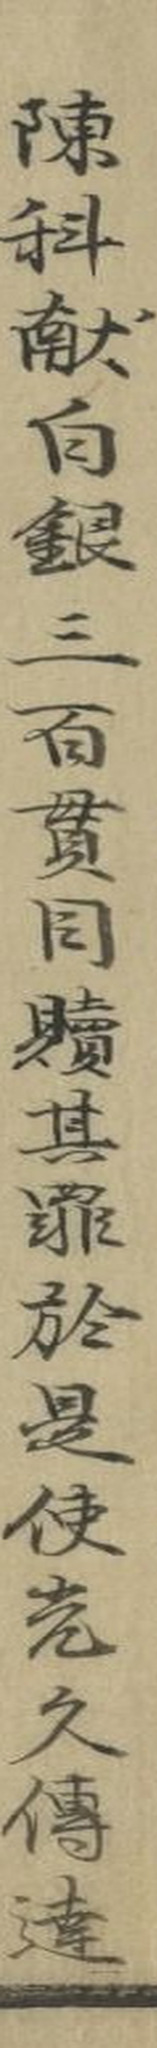陳科献白銀三百貫目贖其罪於是使光久伝達
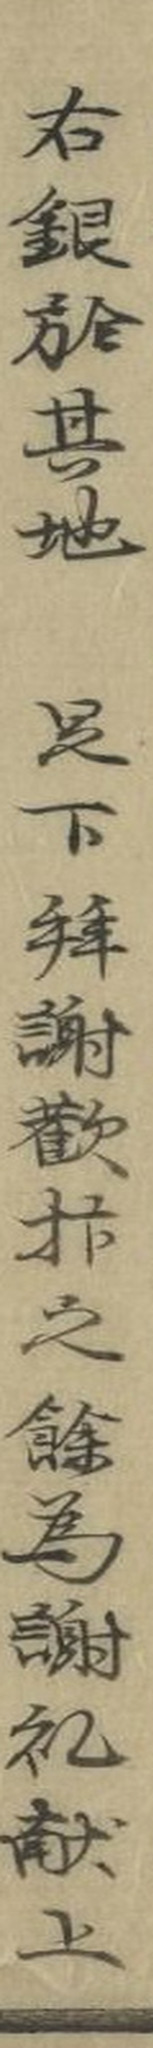右銀於其地足下拝謝歓忭之余為謝礼献上
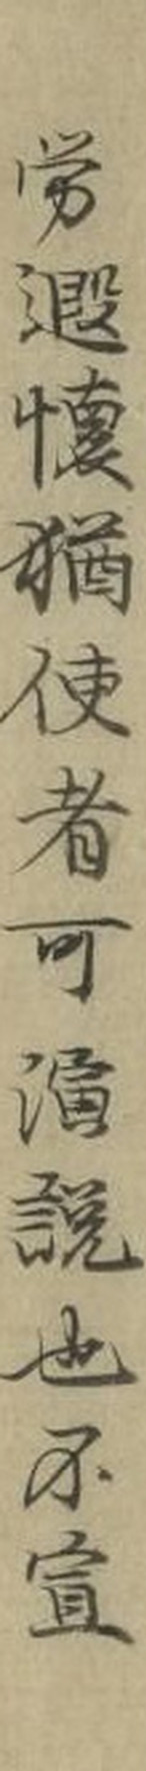労遐懐猶使者可演説也不宣
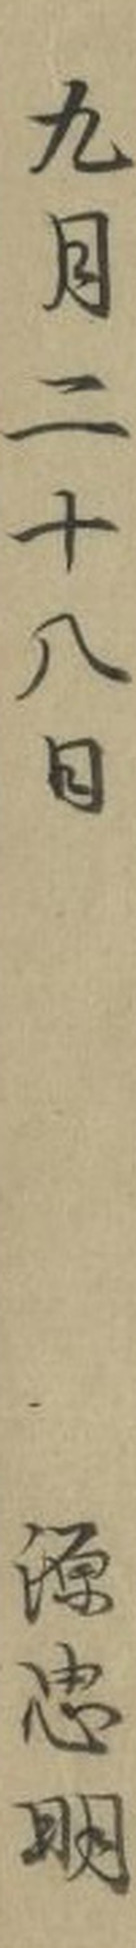九月二十八日源忠明
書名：琉球往来（下）
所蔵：University of the Ryukyus Library
